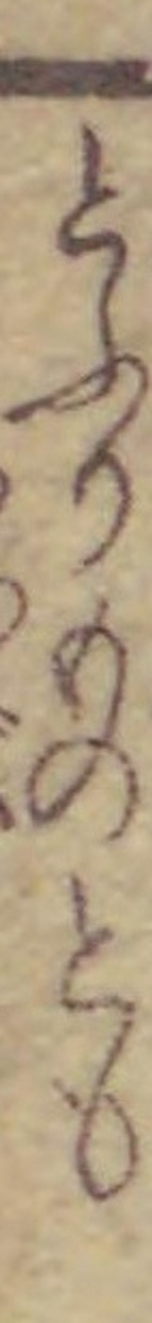とふりものとも

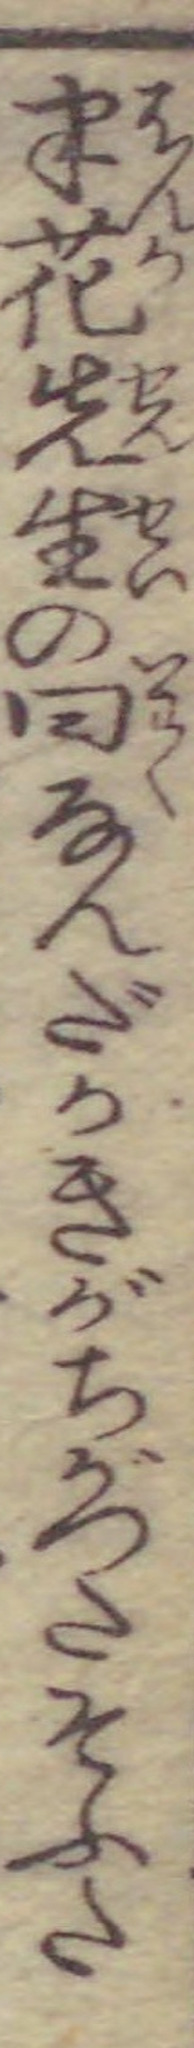半花先生の曰なんだかきがちがつたそふた
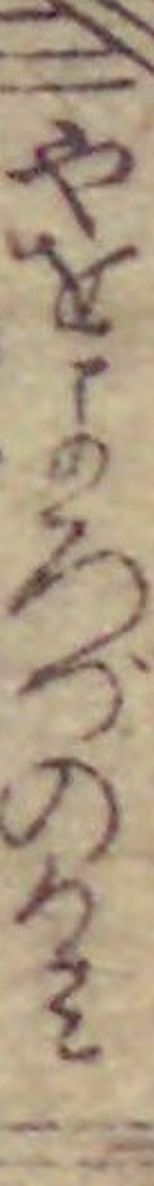やをよろづのかみ
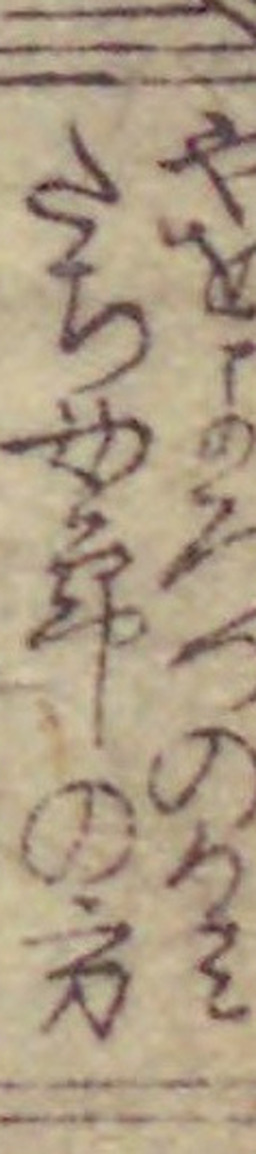たち女郎の方
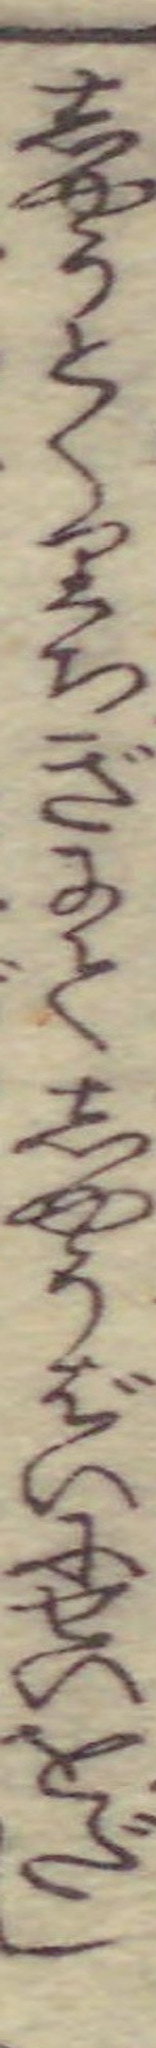しやうとくりちぎにてしやうばいにせいをだし
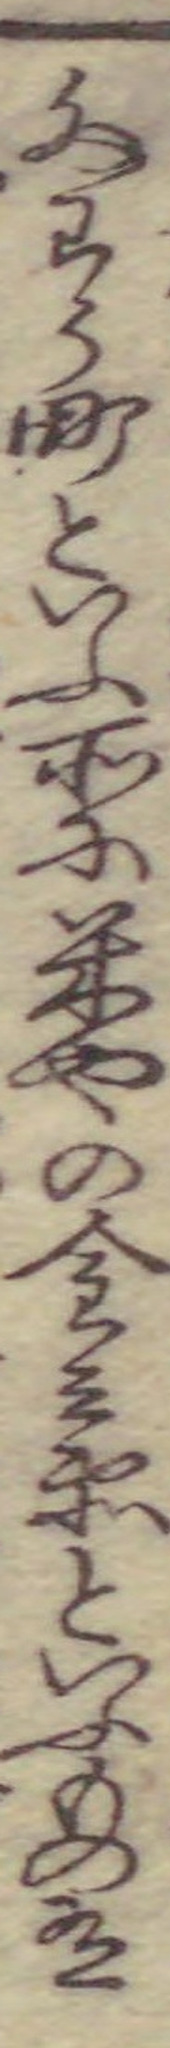文わう町といふ所に米やの金兵衛といふもの有
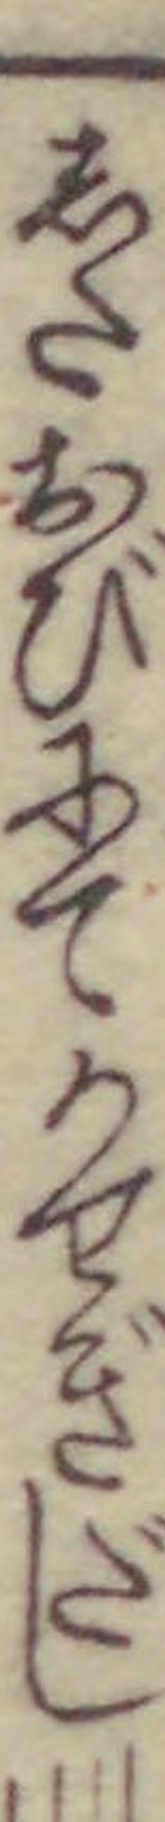したおびにてかせぎだし
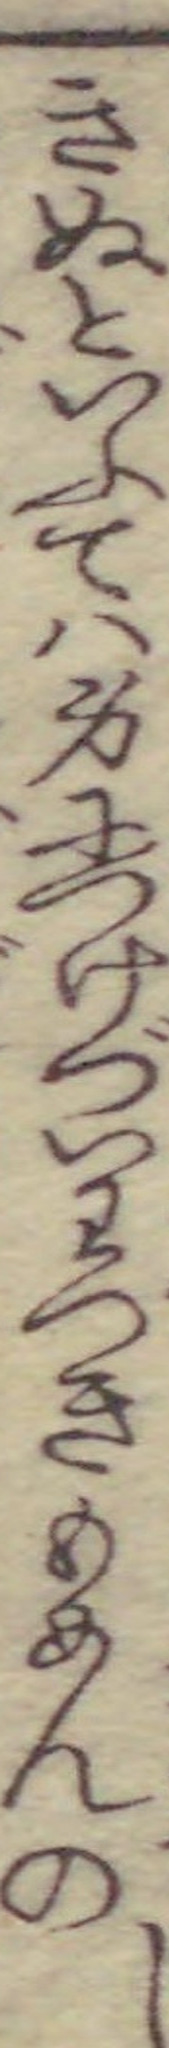きぬといふては身につけづいわつきもめんの
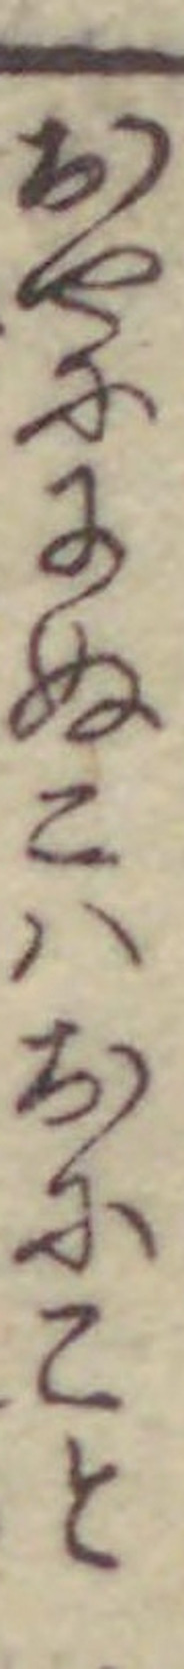おやににぬこはおにこと
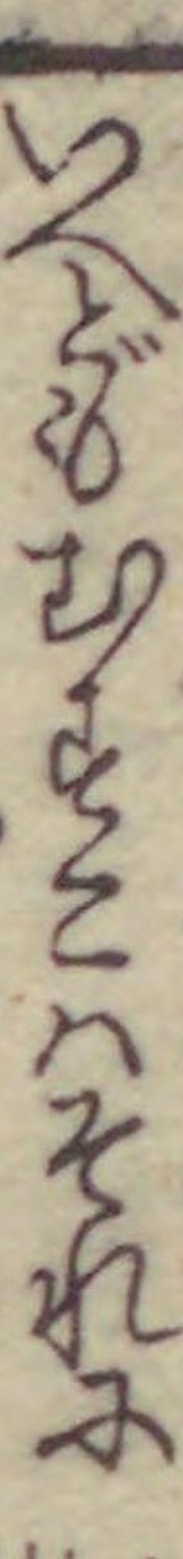いへどもむすこはそれに
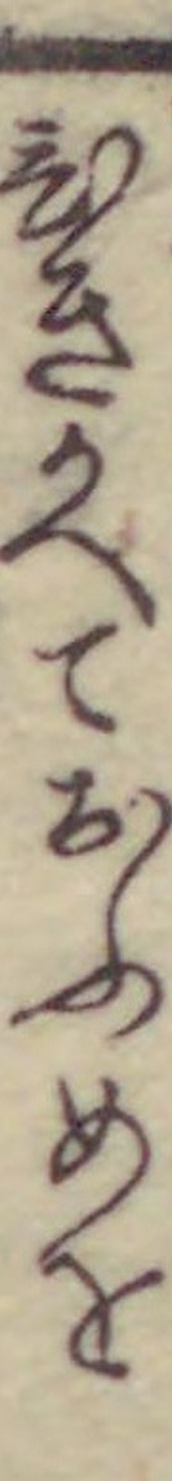ひきかへておふめを
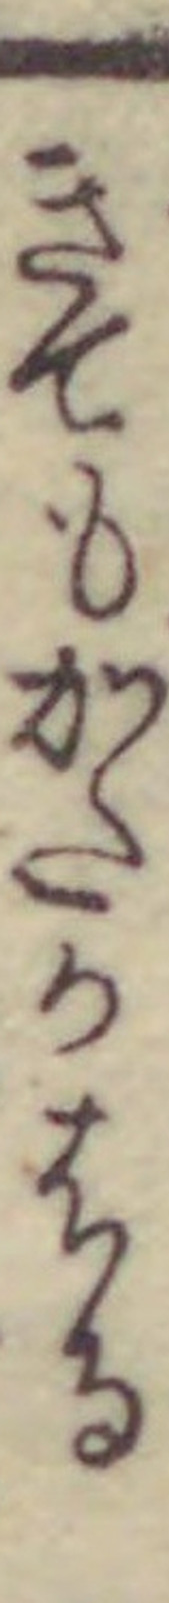きてもかたかはる
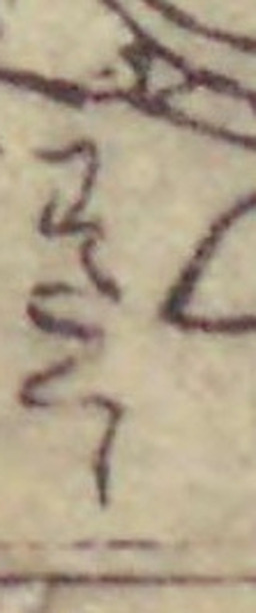わたくし
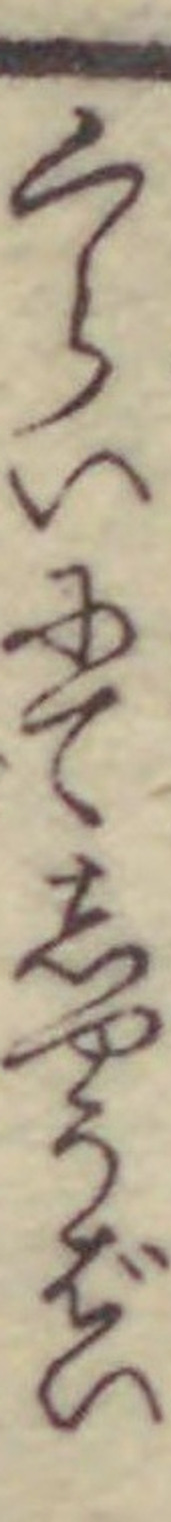くらいにてしやうばい
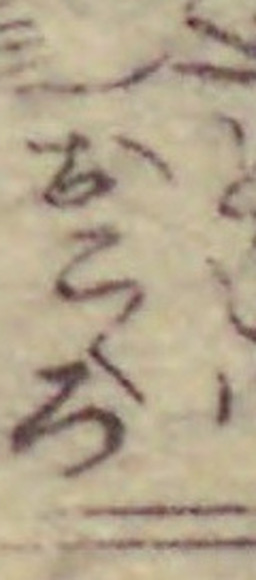おこゝろ
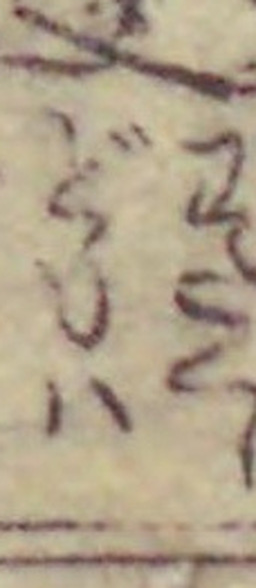どもは
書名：大通人穴[サガシ] 3巻
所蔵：国立国会図書館 National Diet Library, JAPAN
